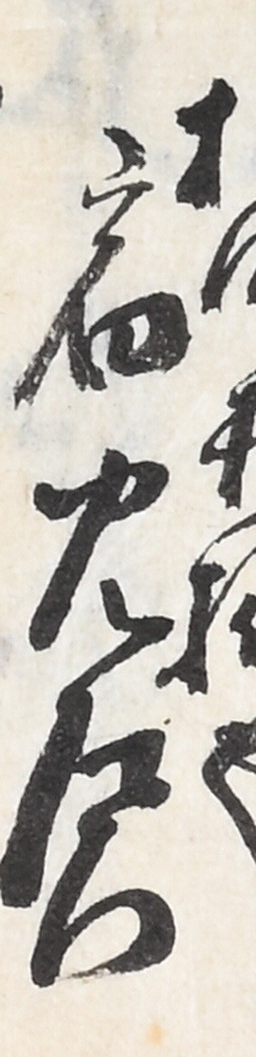宿吉左衛門
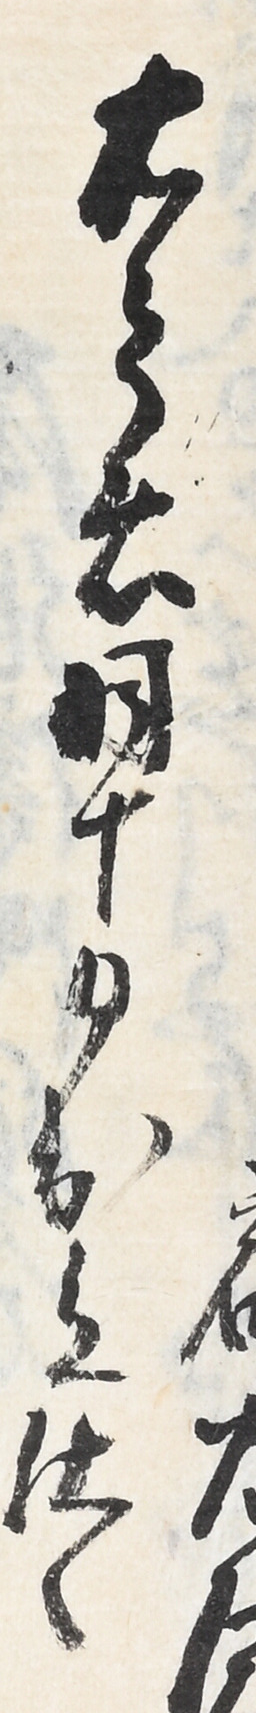右之者同十三日出立仕候
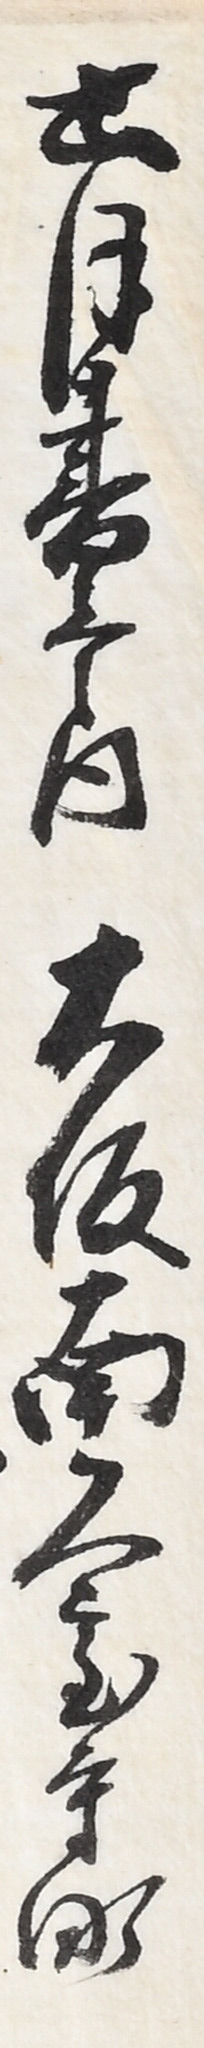六月書上之内大坂南久宝寺町
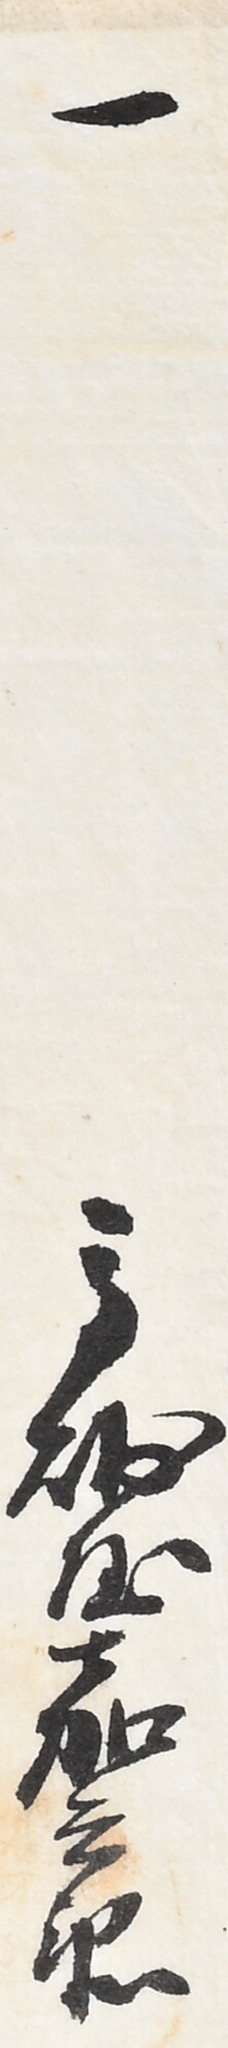一高砂屋嘉兵衛
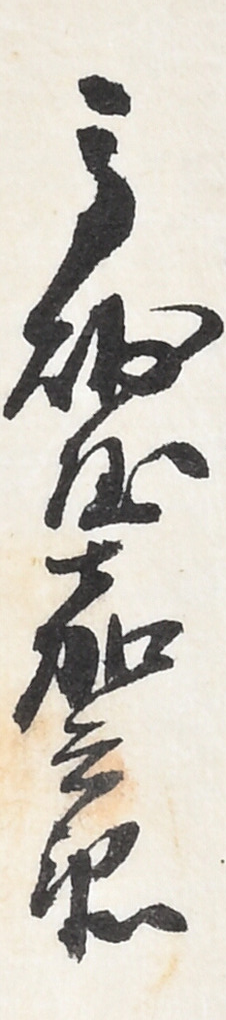一高砂屋嘉兵衛
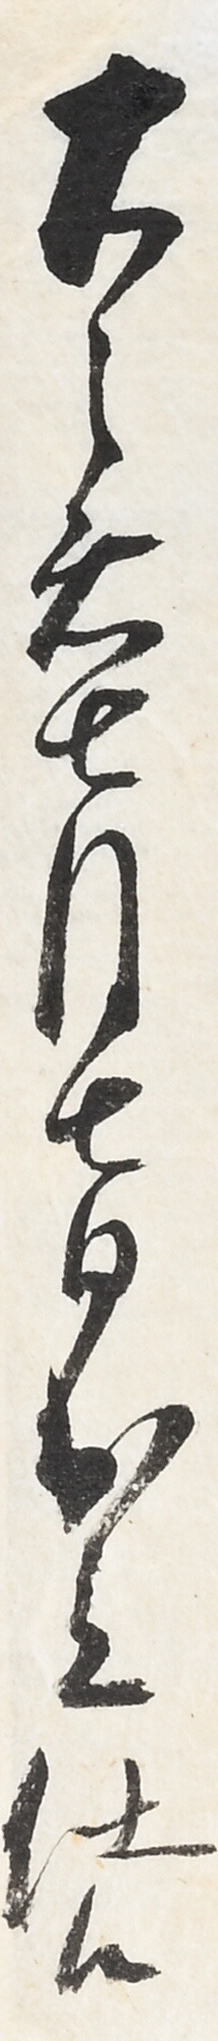右之者七月七日出立仕候
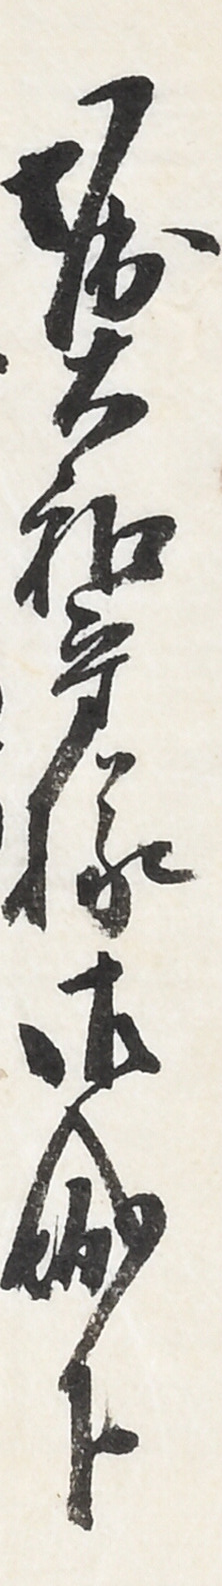堀大和守様御城下
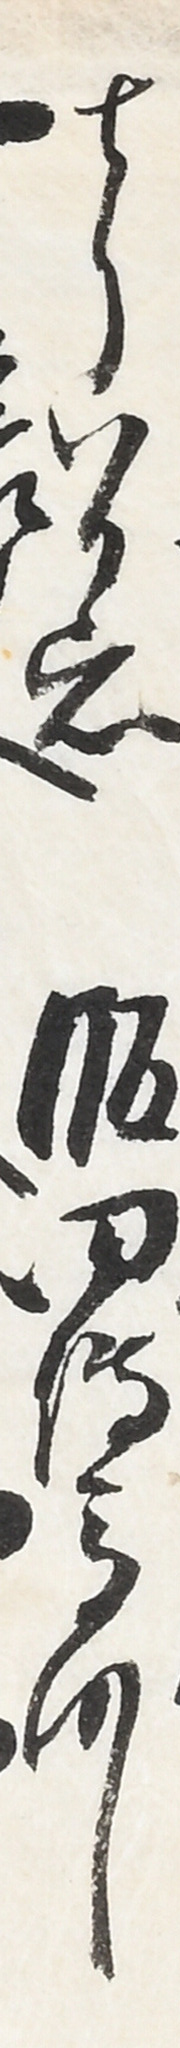七月八日着飯田伝馬町
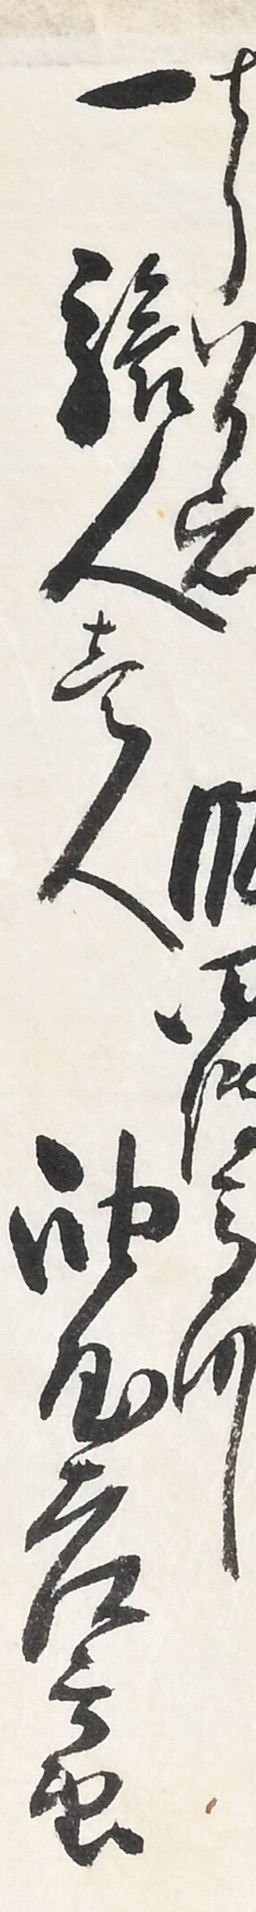一旅人壱人油屋吉兵衛
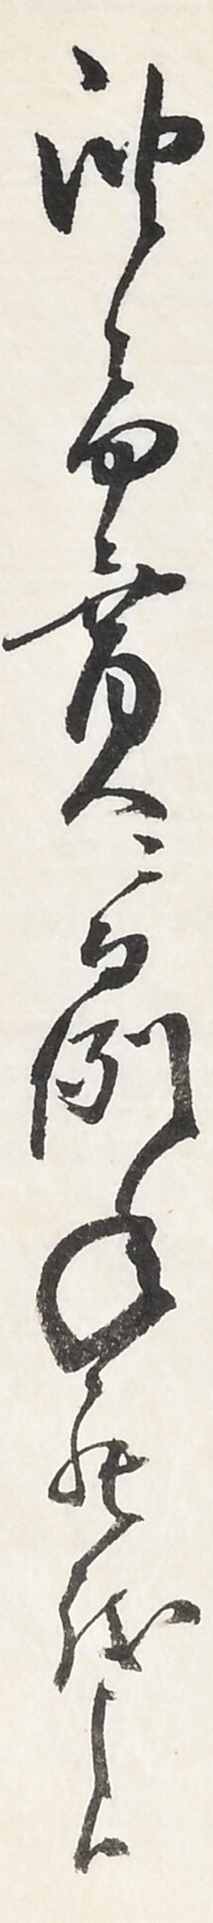油商売ニ而例年罷越申候
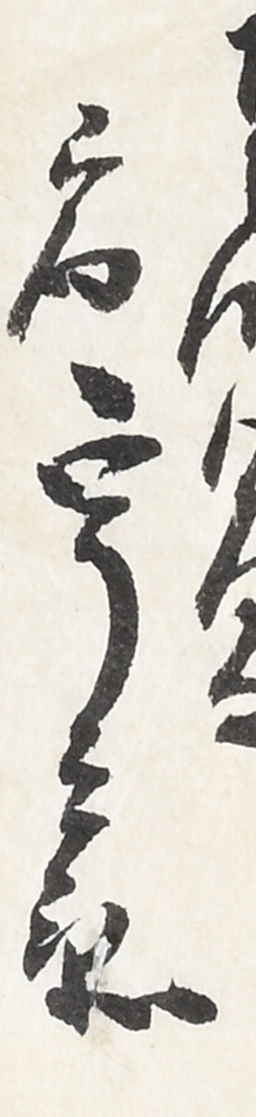宿宇兵衛
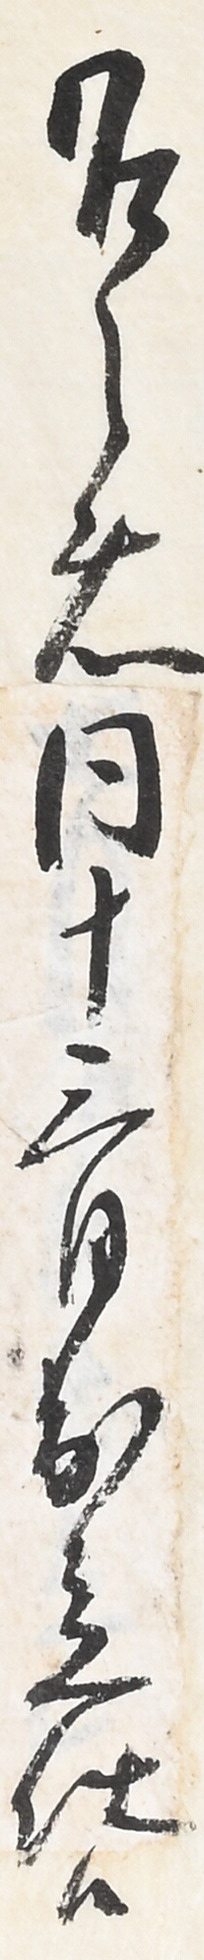右之者同十三日出立仕候
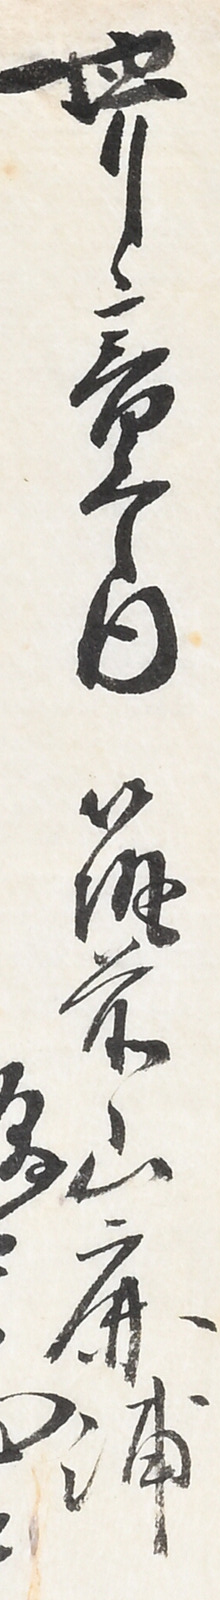四月書上之内筑前山鹿浦
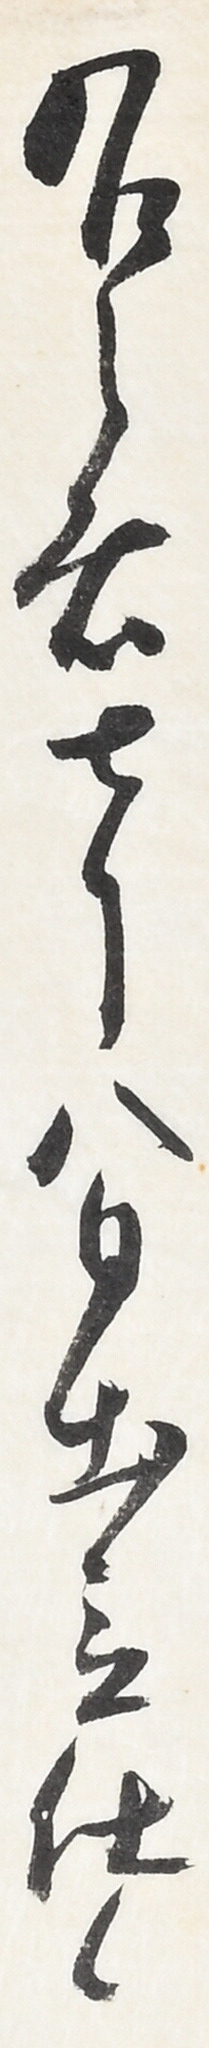右之者七月八日出立仕候
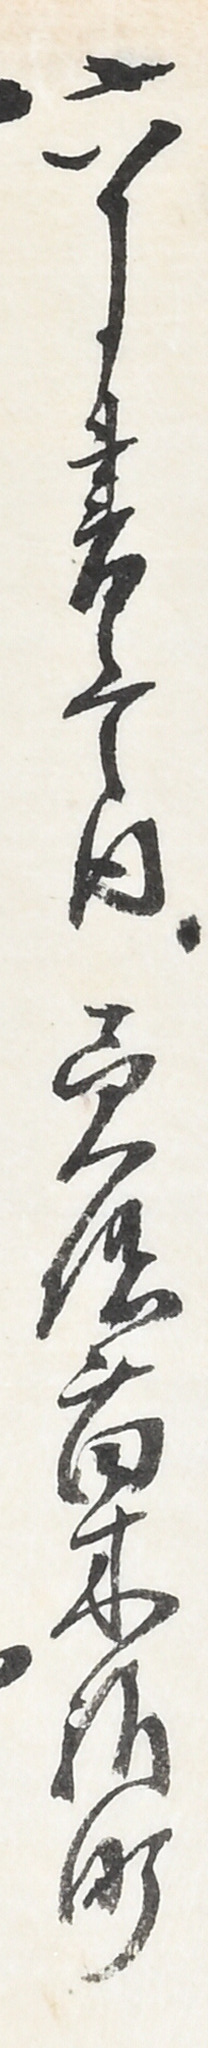六月書上之内美濃苗木新町
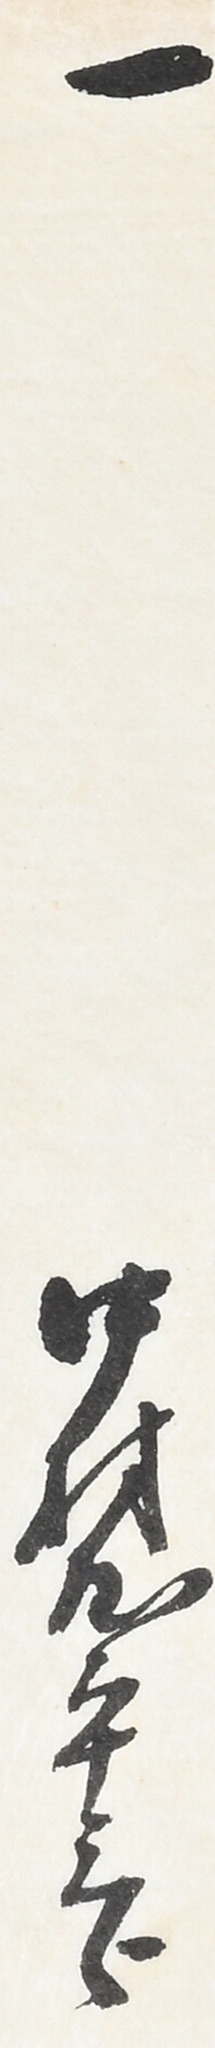一中村屋平三郎
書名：旅人泊控帳
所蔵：伊那市立高遠町図書館・合同会社AMANE
